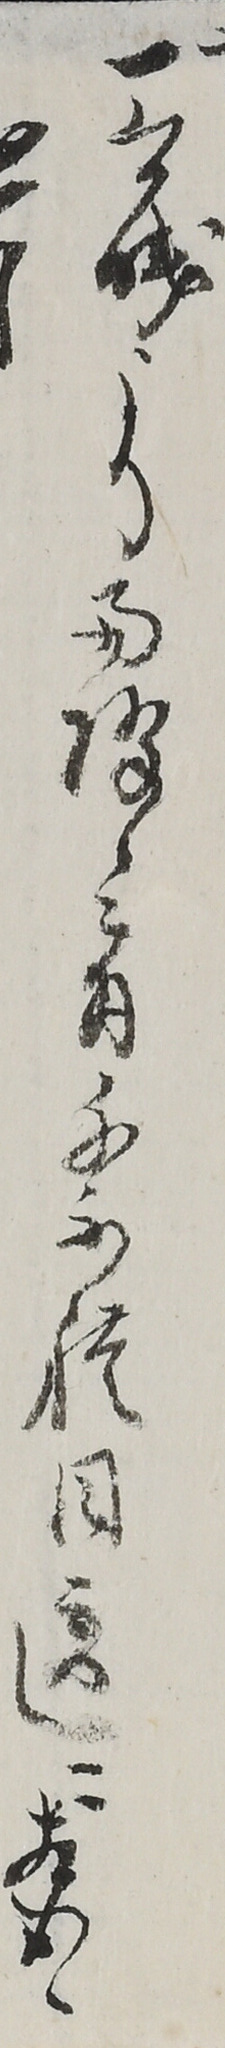一今暁より雨没候ニ付千不礼目適ニ相成候
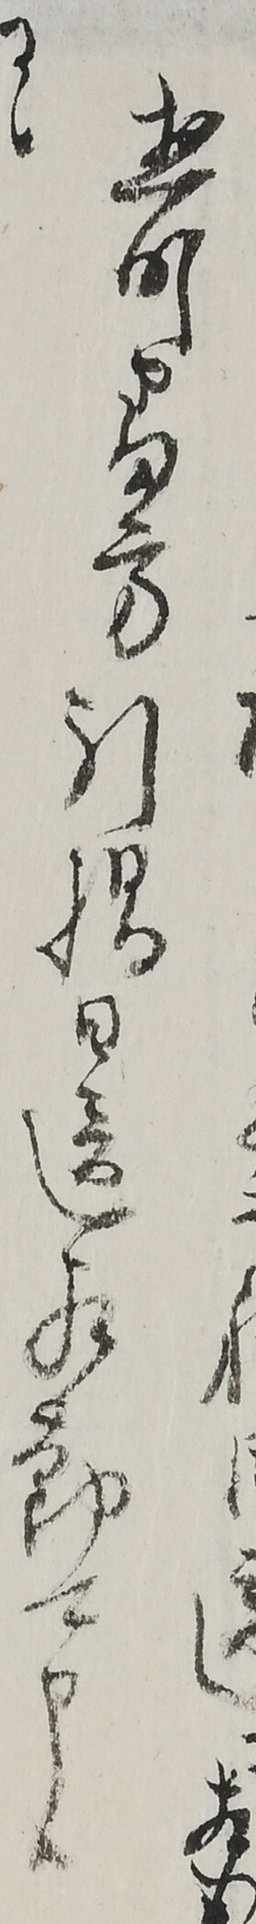惣町番方引揚日適相勤可申候
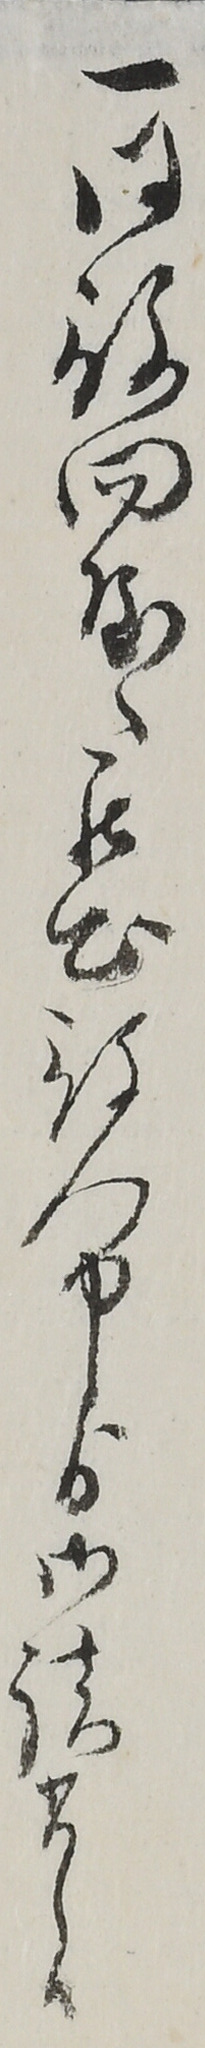一同役問屋へ罷出役人申ゟ御請有之候
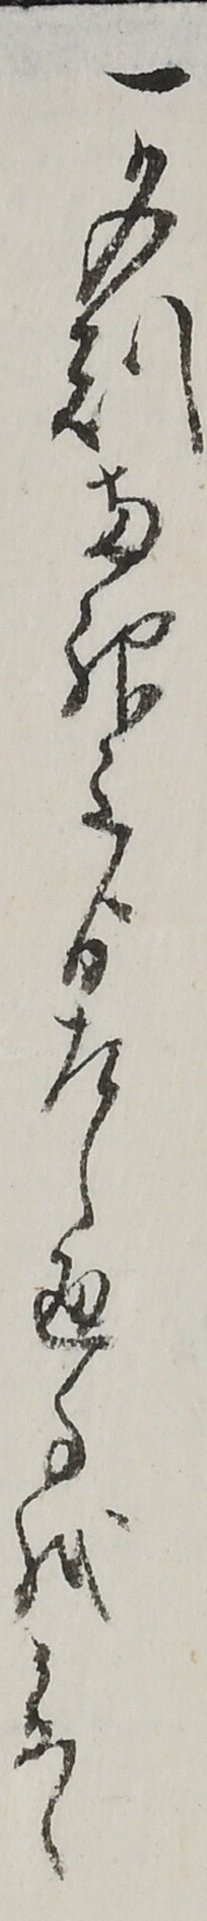一夕刻両神主ゟ左之通手紙参候
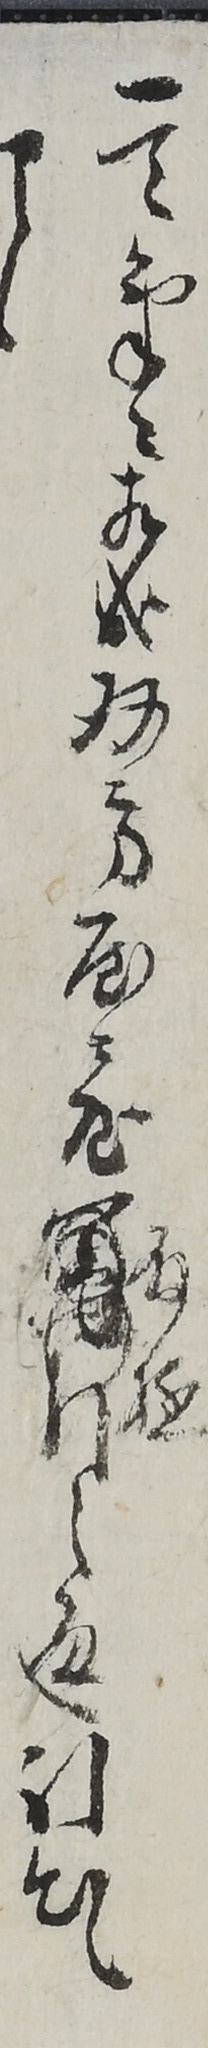一天気ニ相成双方屋台取極之通引出候
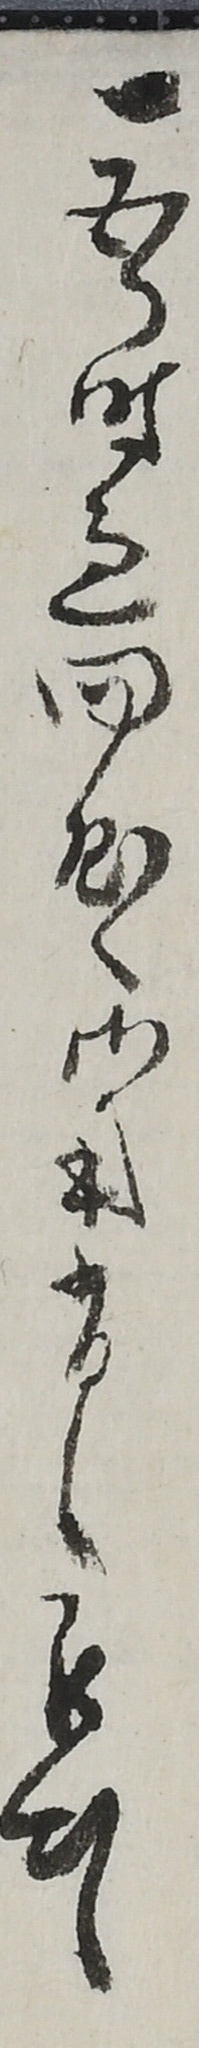一五ツ時過問屋へ御用有之罷出候
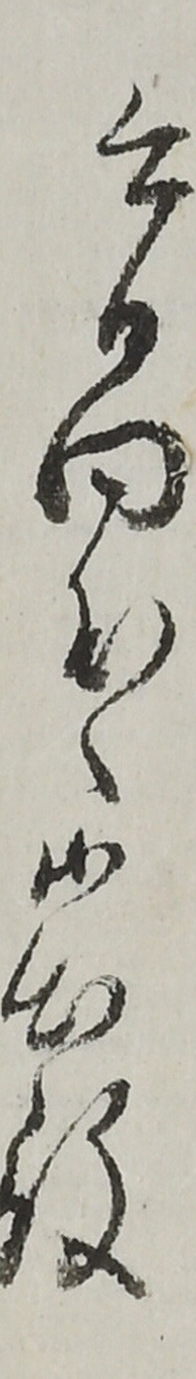今日問屋へ御出役
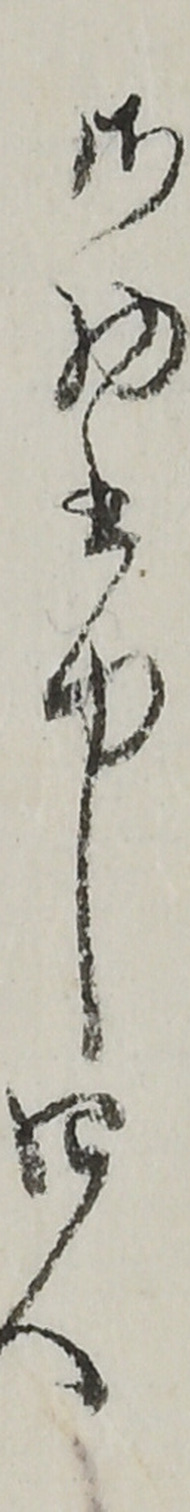御物書中四人
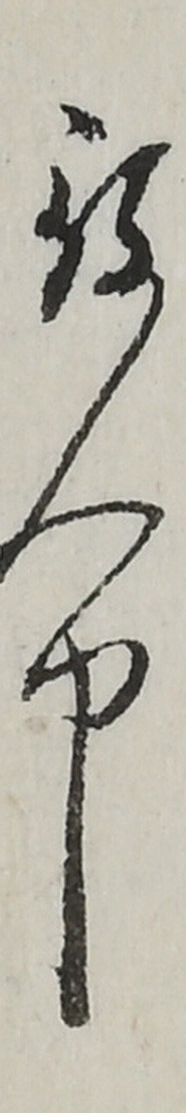役人中
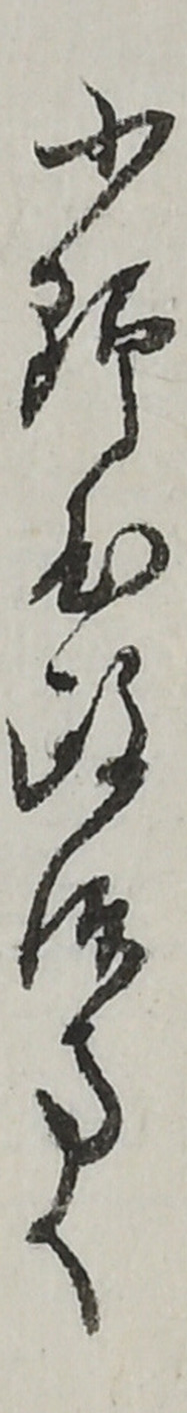小野屋政治方へ
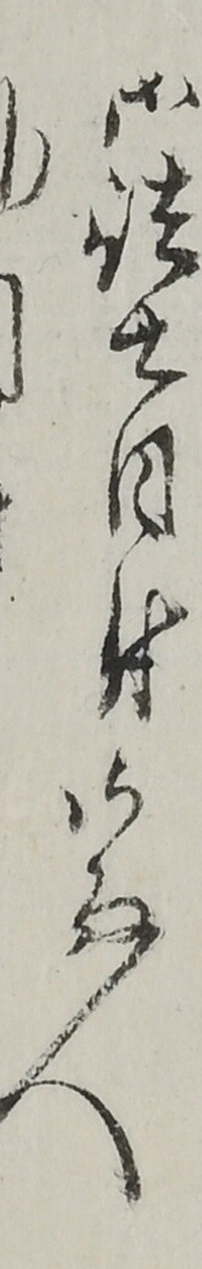御徒士目付御両人
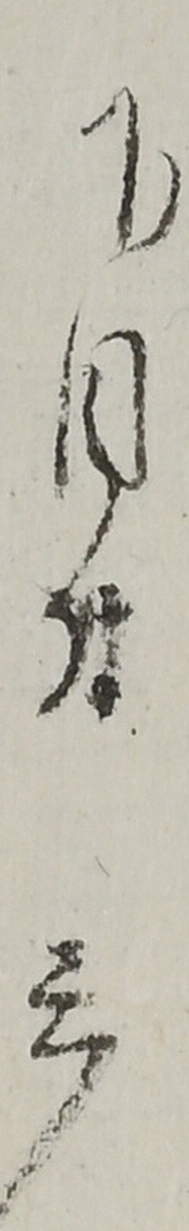下目付壱人
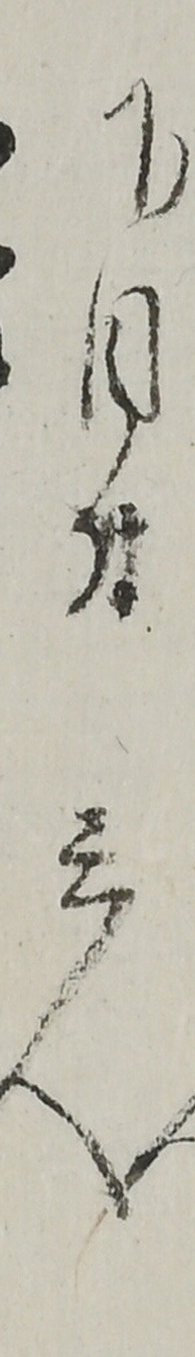下目付壱人
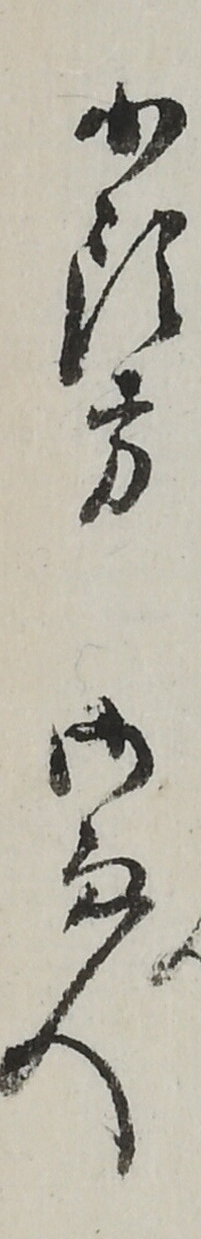小頭方御両人

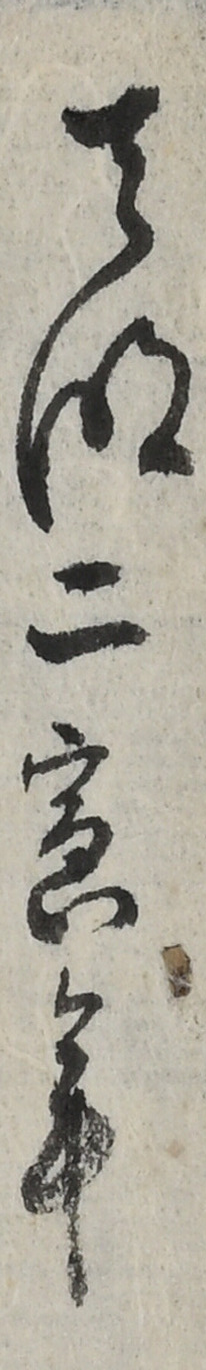天明二寅年
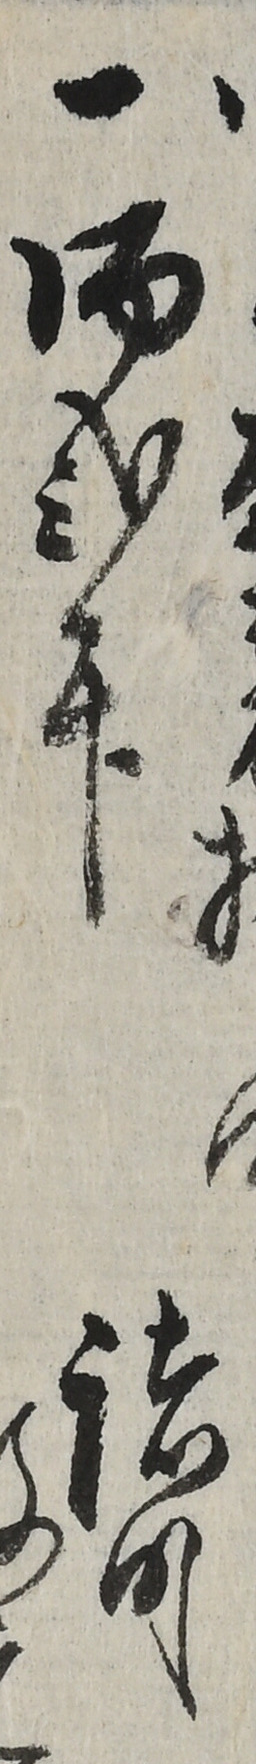一酒弐升諸町
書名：覚書
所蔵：伊那市立高遠町図書館・合同会社AMANE
